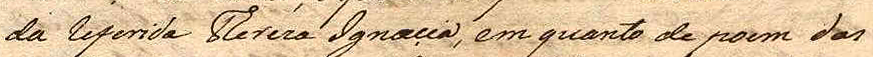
da Referida Thereza Ignacia, emquanto depoem das
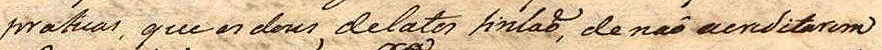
praticas, que os dous delatos tinhaõ, de naõ acreditarem
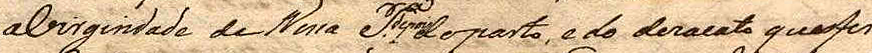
a Virgindade de Nossa S.ra do parto, e do dezacato que fes
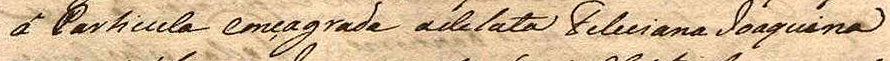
á Particula conçagrada a delata Feleciana Ioaquina
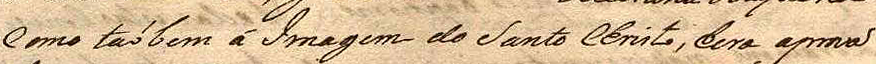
como taõbem á Imagem do Santo Christo, hera a prova
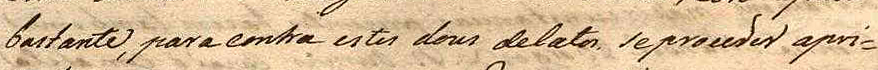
bastante, para contra estes dous delatos se proceder a pri
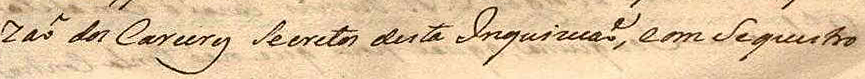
zaõ dos Carceres secretos desta Inquizicaõ, com Sequestro
